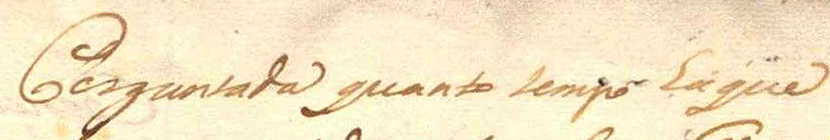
Perguntada quanto tempo ha que
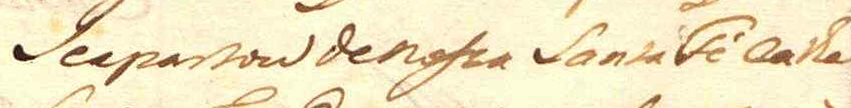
se apartou de nossa Santa Fé catha
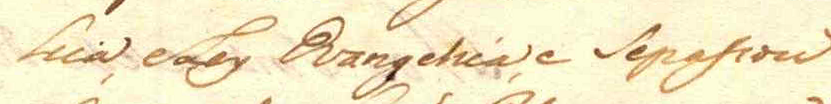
lica, e Ley Evangelica, e se passou
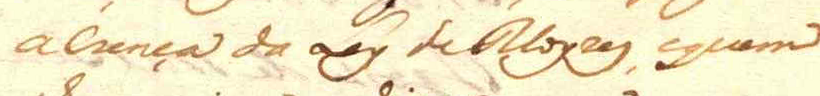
a crença da Ley de Moyzes, e quem
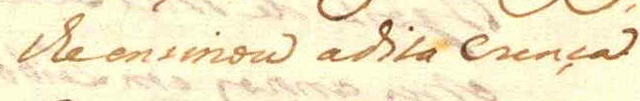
lhe ensinou a dita crença
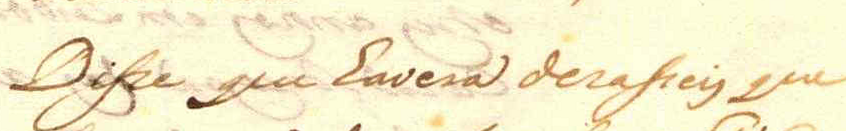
Disse que havera dezasseis que
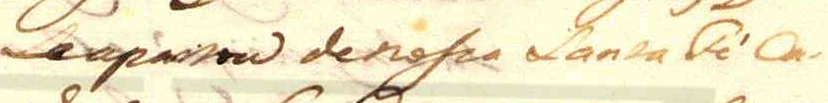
se apartou de nossa Santa Fé Ca
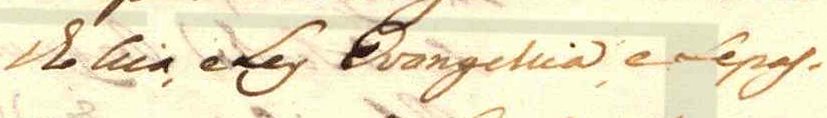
tholica, e Ley Evangelha, e se pas
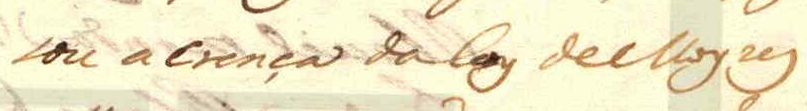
sou a crença da ley de Moyzes
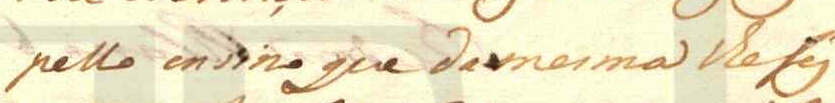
pello ensino que da mesma lhe fes
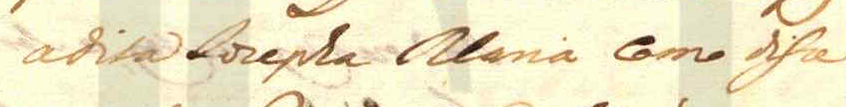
a dita Iozepha Maria como disse
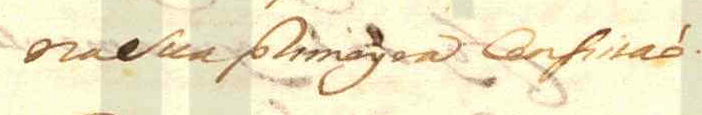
na sua primeyra Confissaõ.
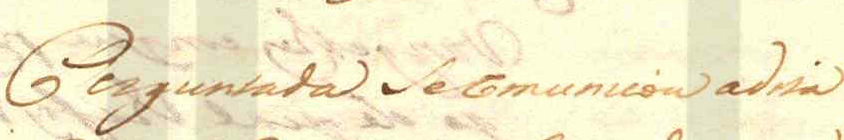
Perguntada se comunicou a dita
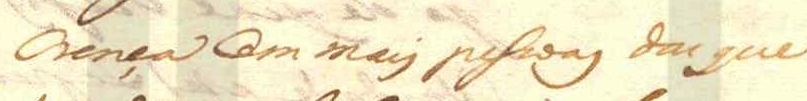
crença Com mais pessoas das que
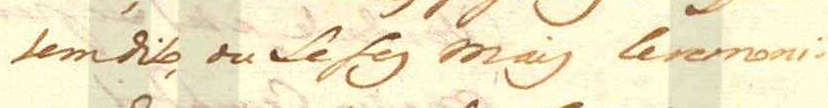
tem dito, ou se fes mais ceremoni
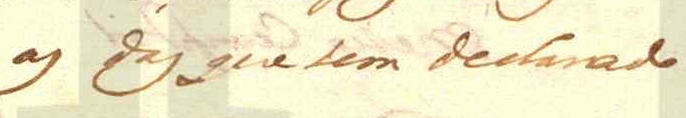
as das que tem declarado
